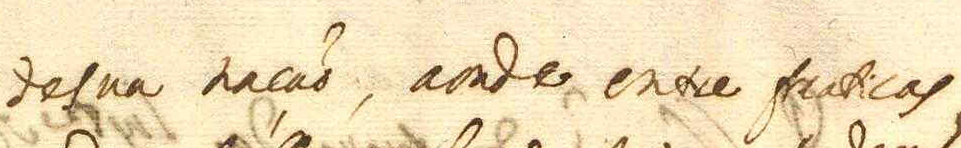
de sua naçaõ, aonde entre praticas
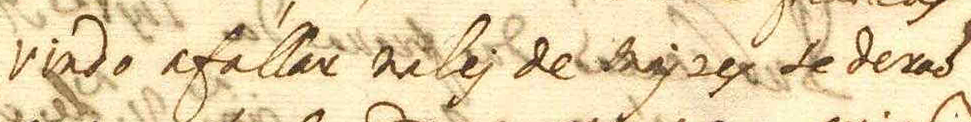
vindo a fallar na lej de moyzes se deraõ
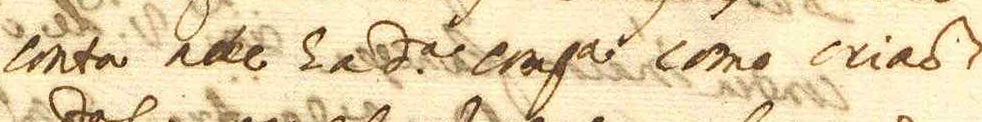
conta a re E a d̄.a compa como criaõ
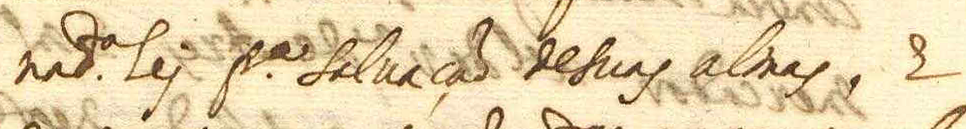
na d̄.a lej p.a saluaçaõ de suas almas, E
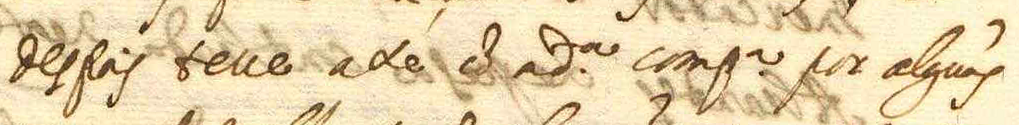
despois teue a re cō a d̄.a compa. por alguās
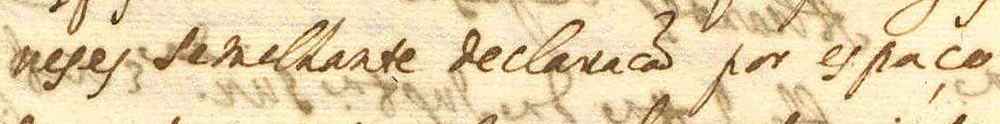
ueses semelhante declaraçaõ por espaço
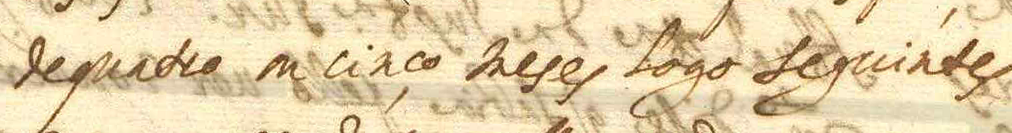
de quatro ou cinco meses logo seguintes
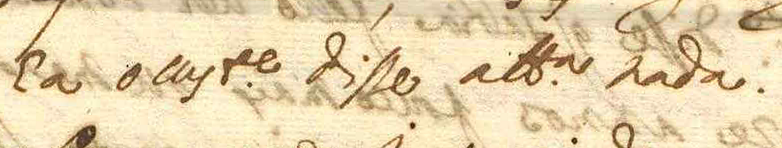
E ao cust.e disse a tt.a nada.
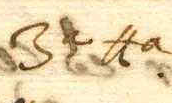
3a tta.
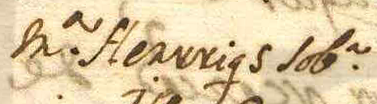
Ma. Henrriꝗs soba.
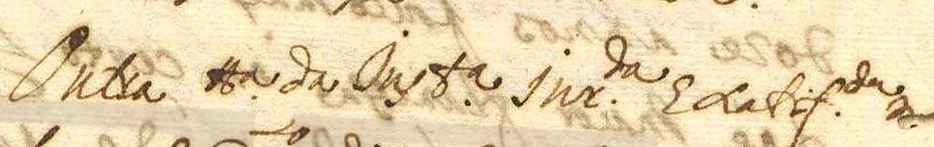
Outra tta. da Iust.a Iur.da E ratif.da
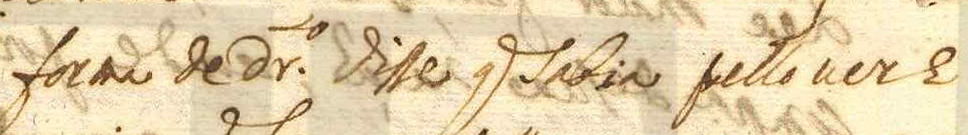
forma de dr.to disse q̄ sabia pello uer E
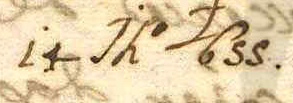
14 Jho 655.
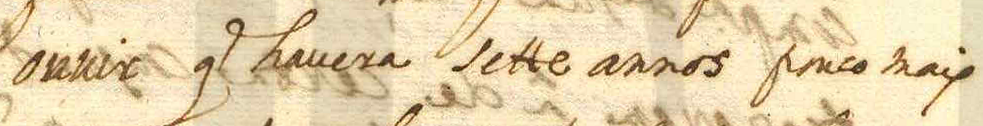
ouuir q̄ hauera sette annos pouco mais
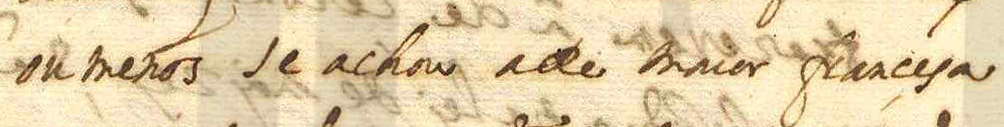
ou menos se achou a Re maior francesa
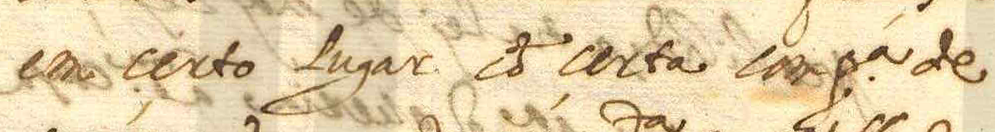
em certo lugar cō certa comp.a de
